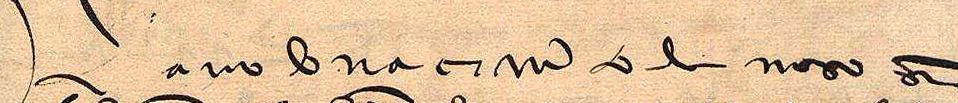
Aano do nacimēto de noso s̄r
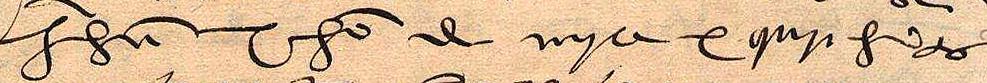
Jhū xpō de mjll e qujnhētos
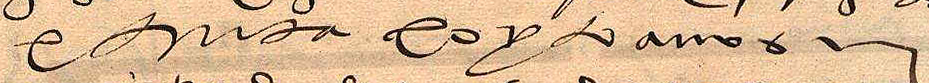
e trinta e oyto anos em
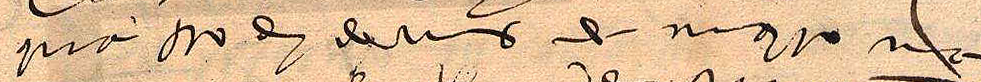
quatro dj do mes de majo na
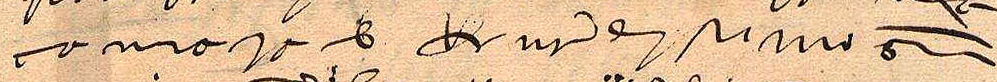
camara do Reurēdjsimo s̄or
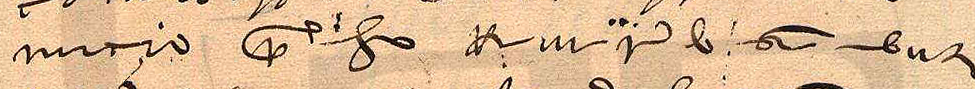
nucio p̄o ho Reuerēdo s̄r doutor
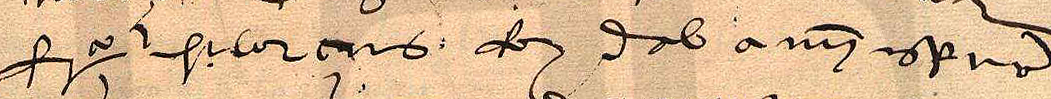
frco pilorcius foj dado a mj̄ espuā
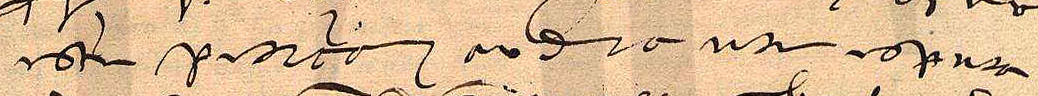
esta petiçam ao diante esprita
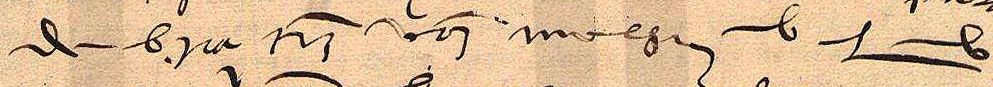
de briatiz vāz molher do Ldo
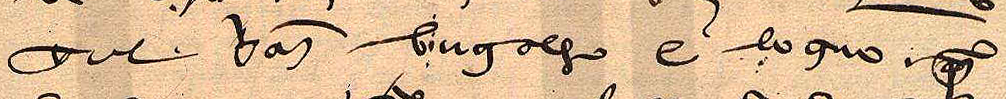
gil v̄az bugalho e loguo p̄o
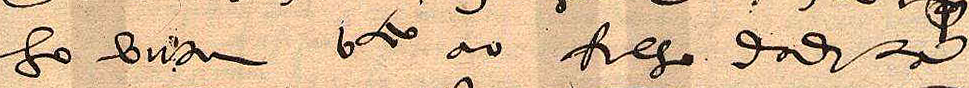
ho doutor vco ao filho da dita
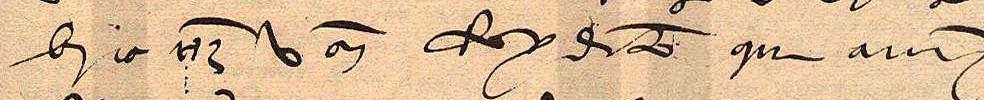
briatiz vāz foy dito que a mj̄
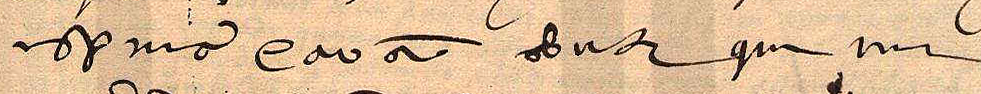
espriuā e ao s̄r doutor que me
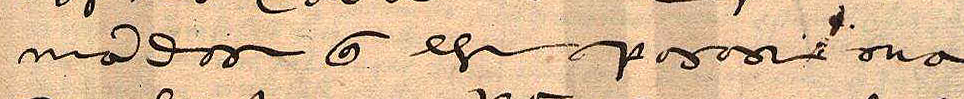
mādase q̄ lhe pasase sua
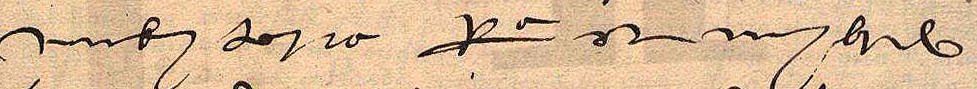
enebjtoria ꝑa se enjbido
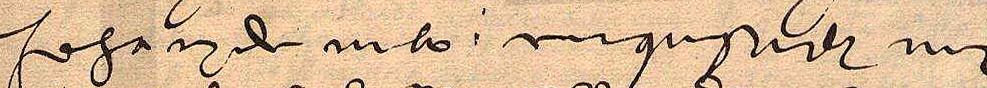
Joham de melo enquisidor mor
